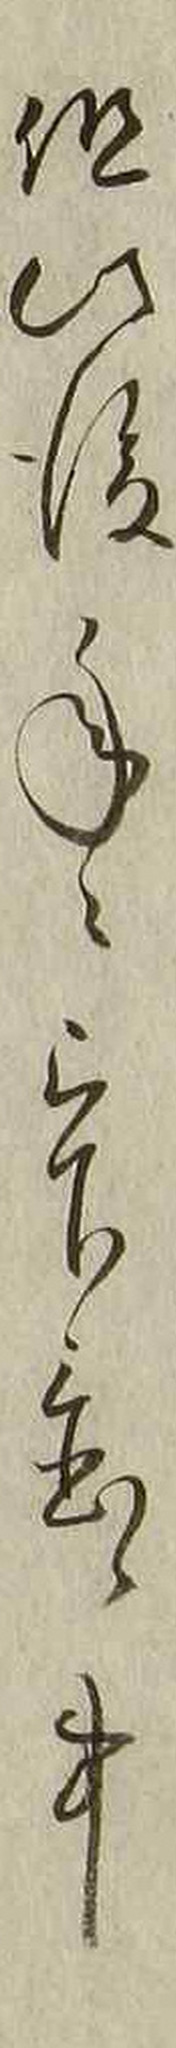但此後年々被下置候事
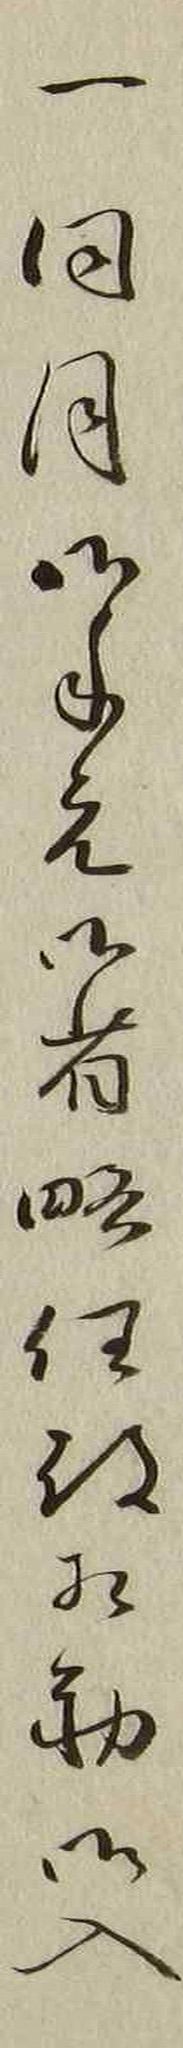一同月御手元御省略任役相勤御入
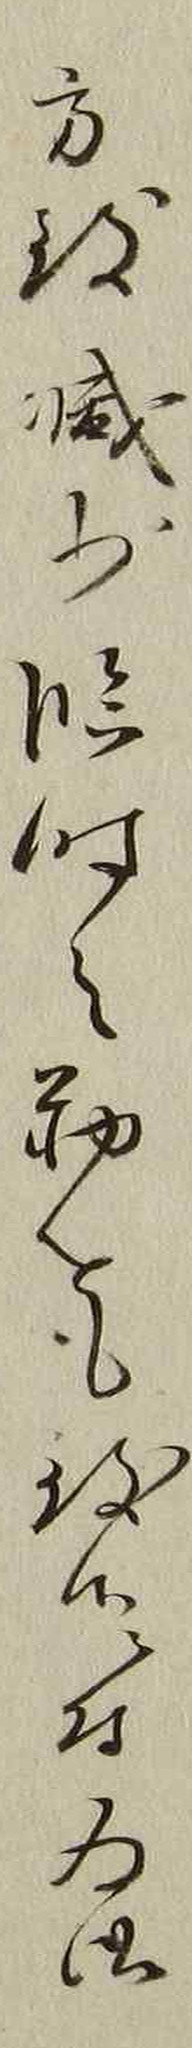方致減少臨時之勤をも致候ニ付為御
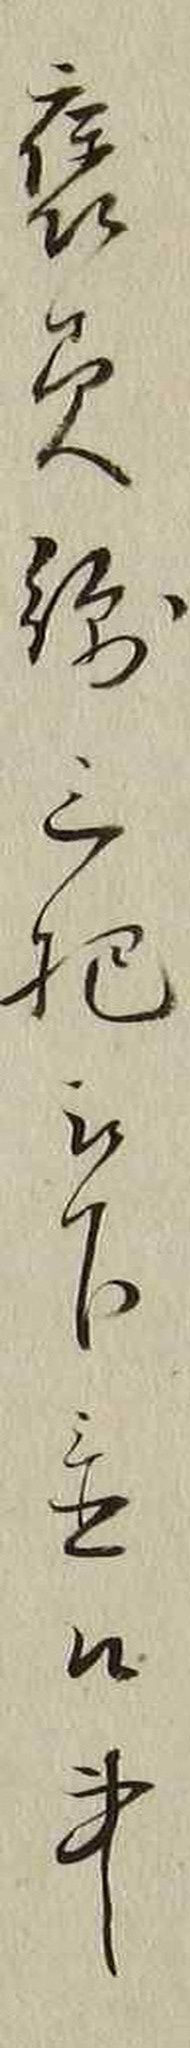褒美綿三把被下置候事
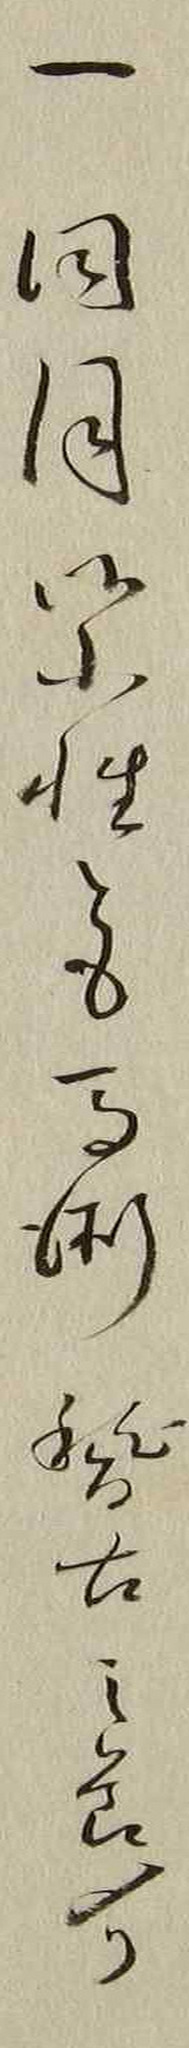一同月御小性とも馬術稽古之節〆り
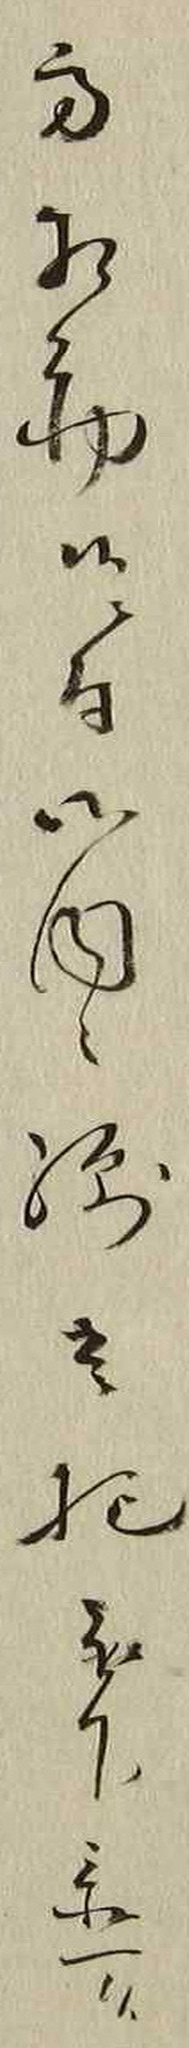方相勤候ニ付御内々綿壱把被下置候
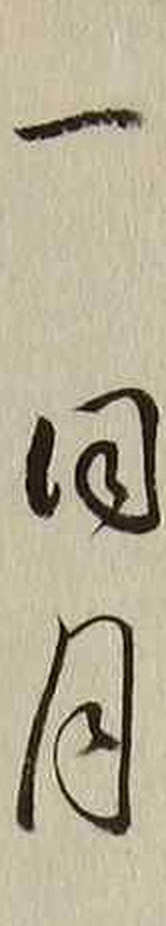一同月
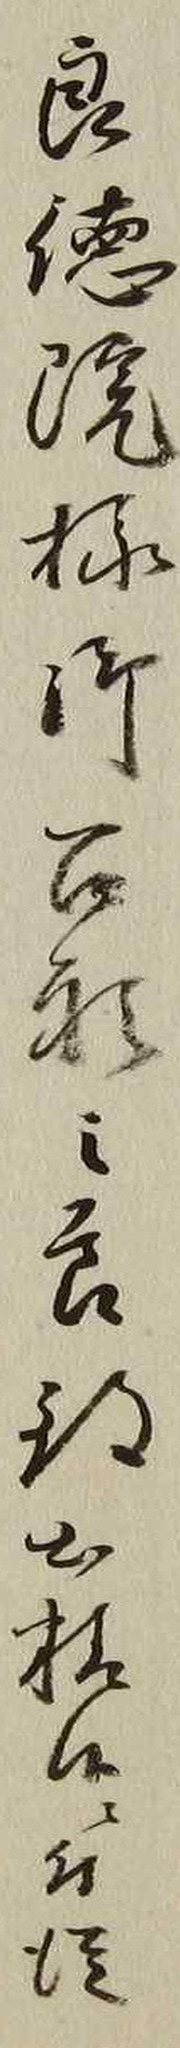良徳院様御召形之節致出精候ニ付従
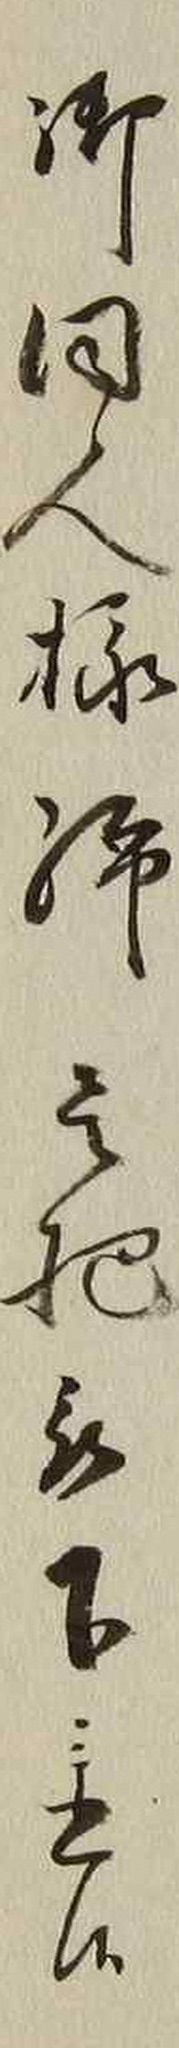御同人様綿壱把被下置候
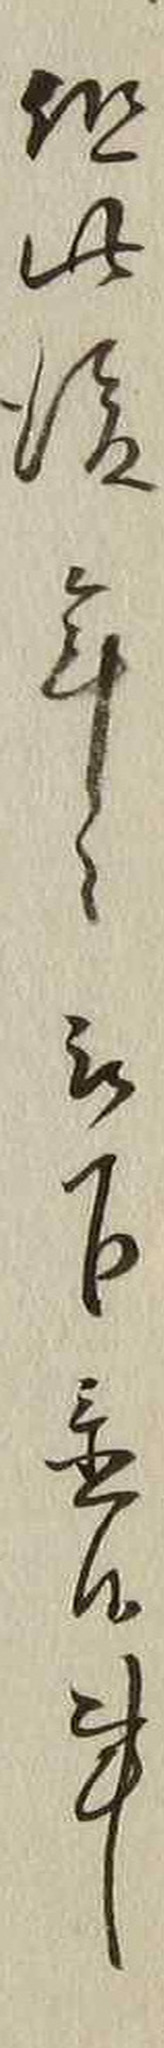但此後年々被下置候事
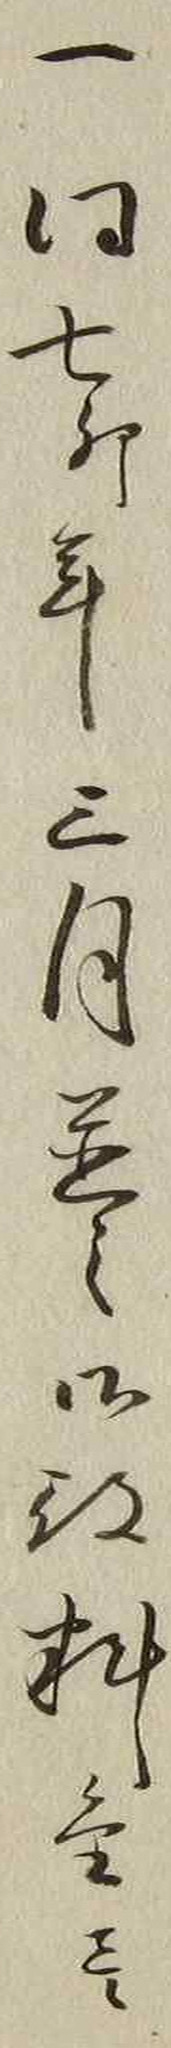一同七卯年三月並之御役料金壱
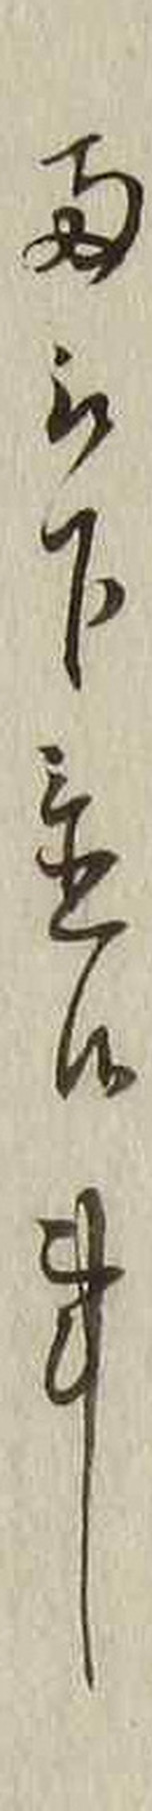両被下置候事
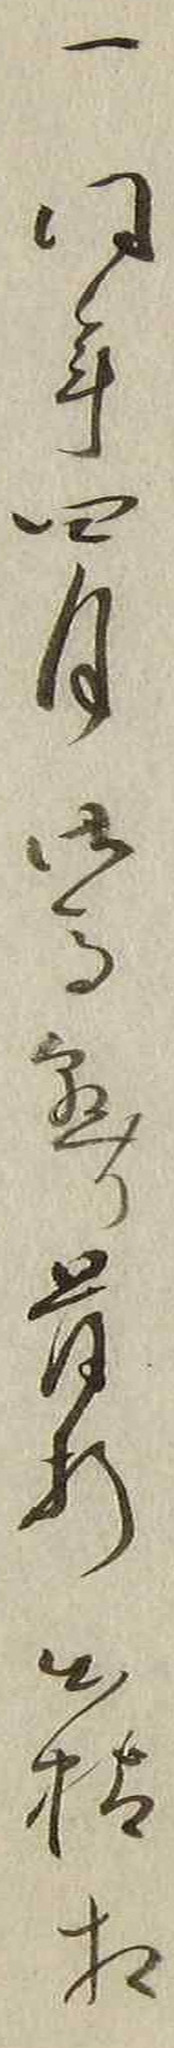一同年四月御馬懸り骨折出精相
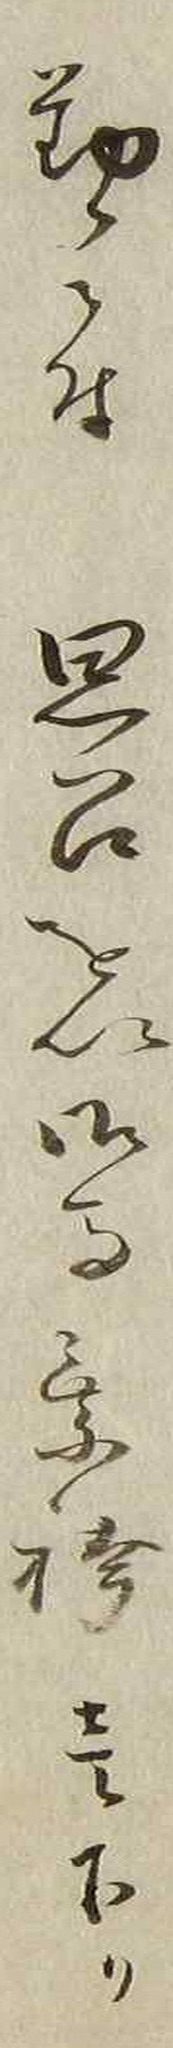勤候ニ付思召を以御馬乗袴壱下り
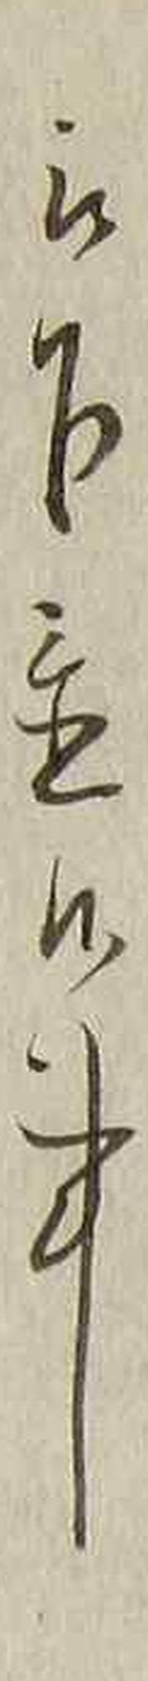被下置候事
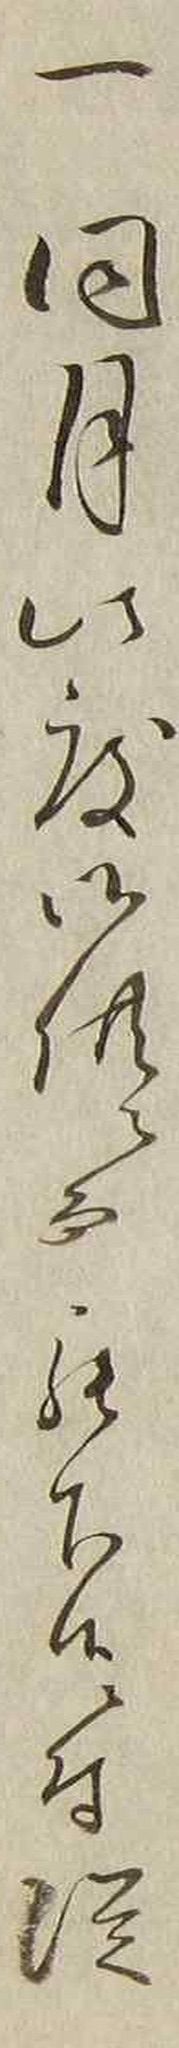一同月此度御供ニ而罷下候ニ付従
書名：諸士系譜　巻之25　い之部25
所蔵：会津若松市立会津図書館
